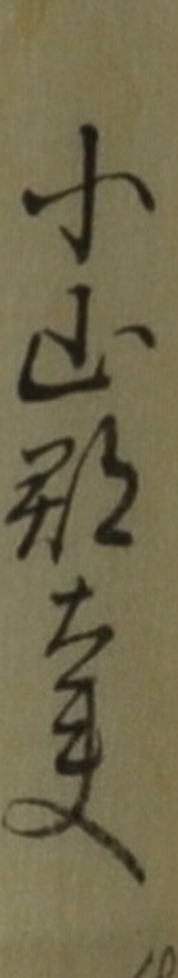小山郡太夫
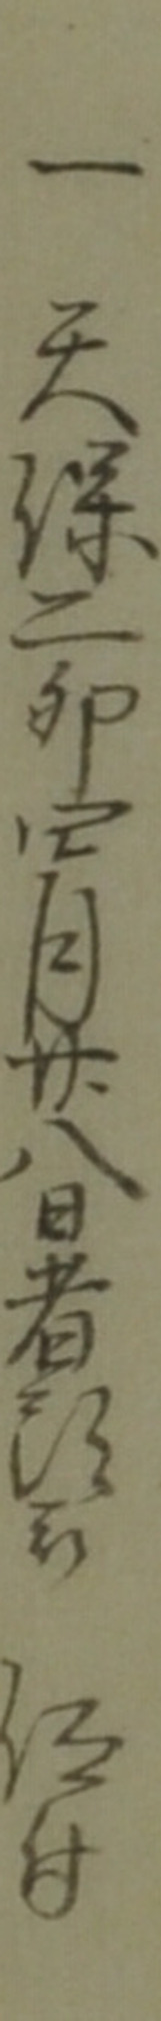一天保二卯四月廿八者頭被仰付
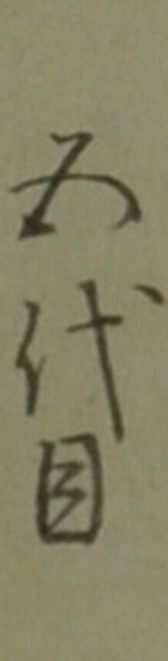五代目
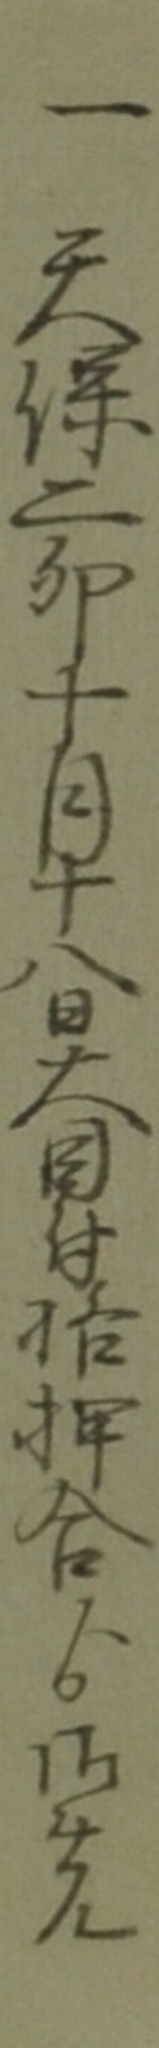一天保二卯十月十八日大目付格押合ゟ御先
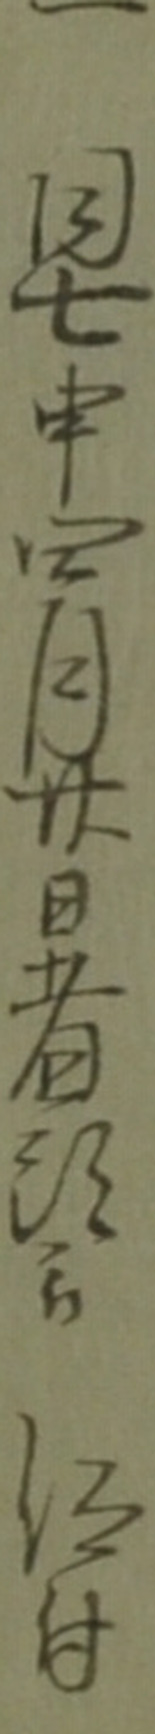一同七申四月廿日者頭被仰付
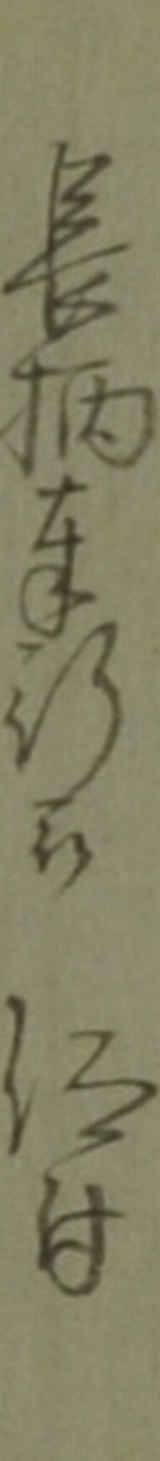長柄奉行被仰付
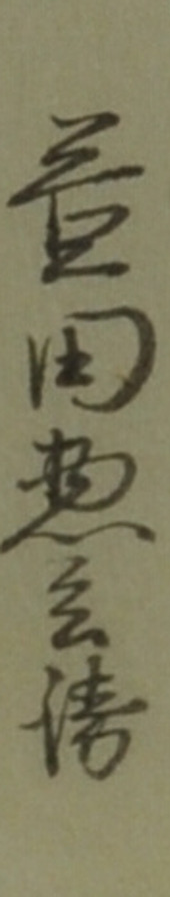益田惣兵衛
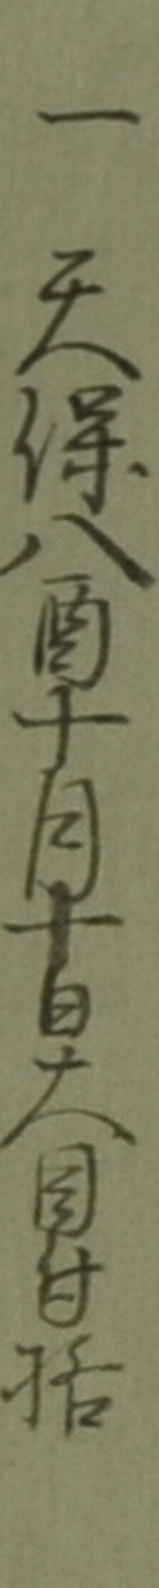一天保八酉十月十日大目付格
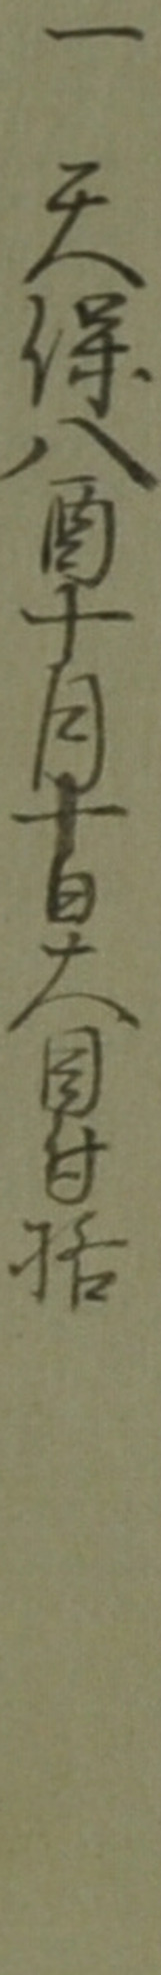一天保八酉十月十日大目付格
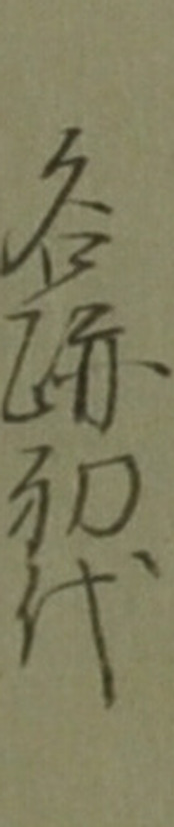名跡初代
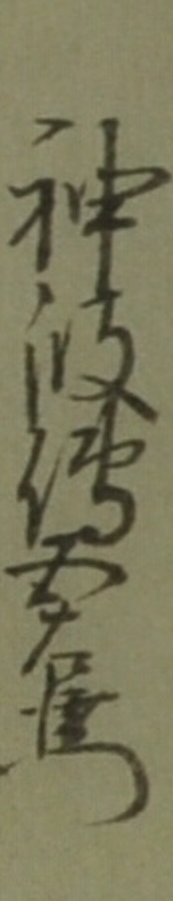神波傳五右衛門
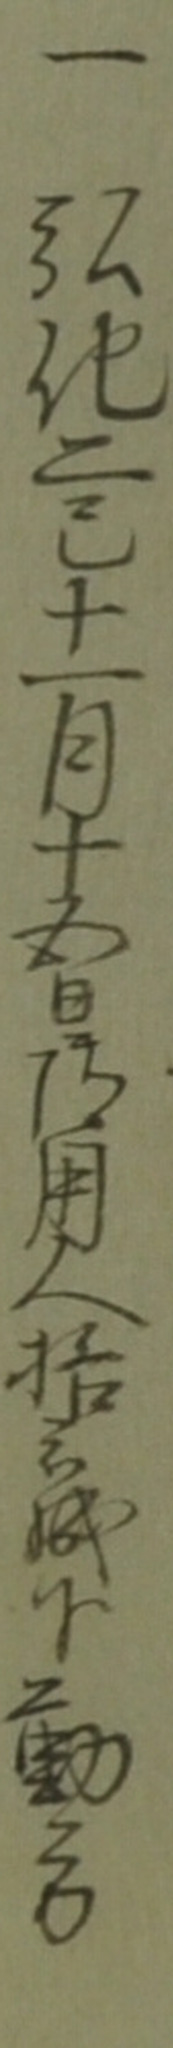一弘化二巳十一月十五日御用人格被成下勤方
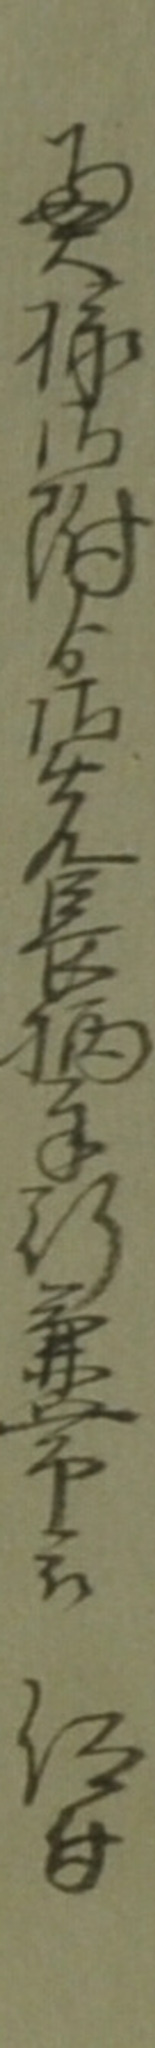奥様御付ゟ御先長柄奉行兼帯被仰勤

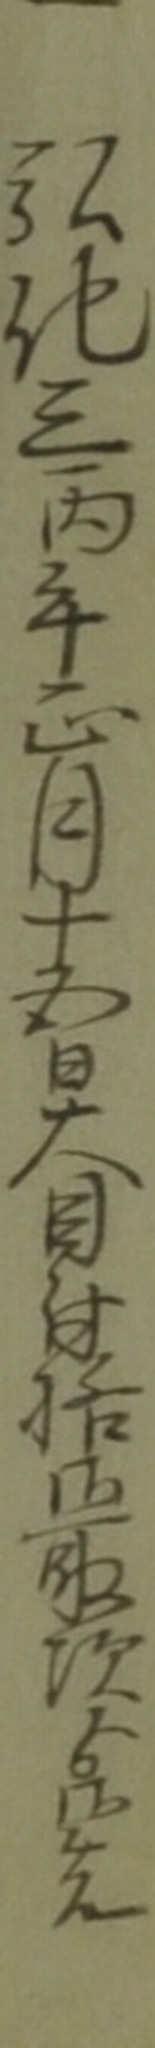一弘化三丙午正月十五日大目付格御取次ゟ御先
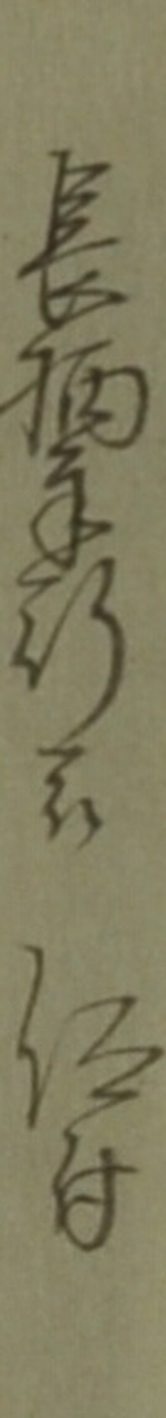長柄奉行被仰付
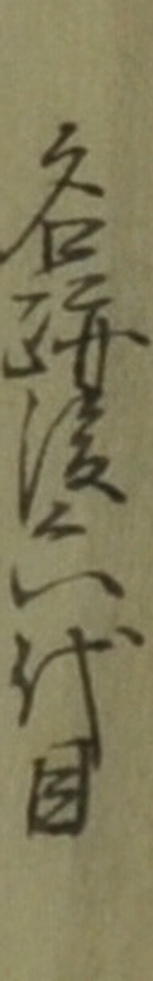名跡後六代目
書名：諸御役代々録（三）
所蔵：伊那市立高遠町図書館・合同会社AMANE
